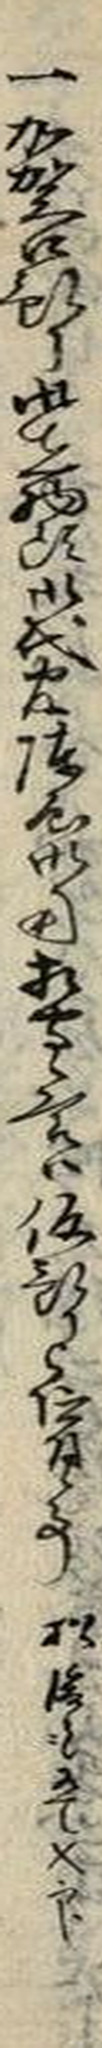一加賀口預り御先物頭御代官陣屋御用相守候節は仮預り被仰付候事猶後ニも有之×印
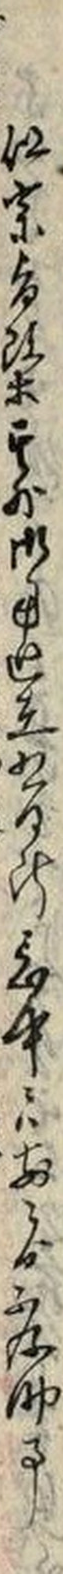但宗旨改等其外御用廻在右同断忌中には前々ゟ不及助事
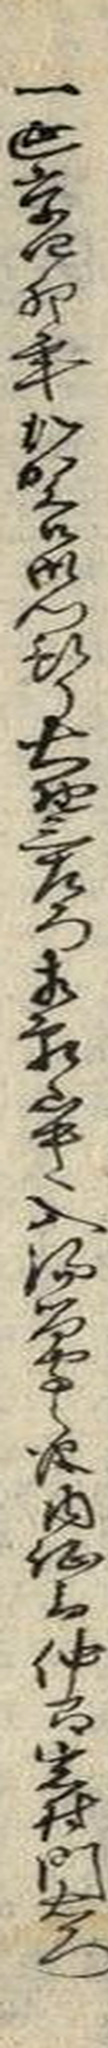一延享四卯年加賀口御門預り大野三左衛門相願山中へ入湯留守之儀内証に而仲間岩村門右衛門
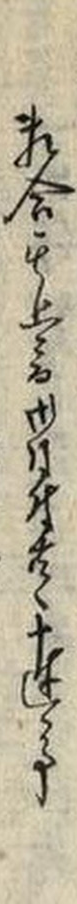頼合其上に而御目付共へ達候事
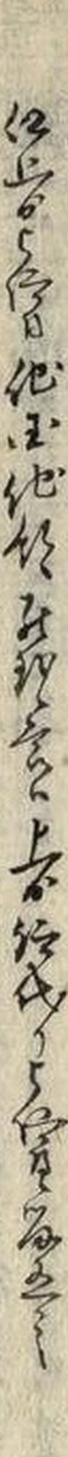但上ゟ被仰付他国他領へ罷越候節は上ゟ跡代り被仰付候留有之
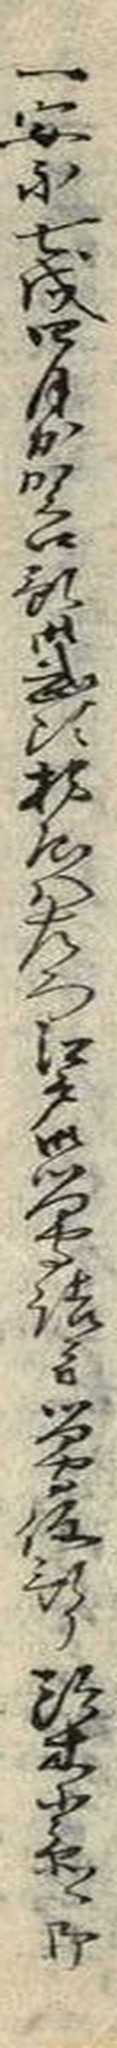一安永七戌四月加賀口預御武頭栃屋八左衛門江戸御留守詰に付留守仮預り鈴木小兵衛へ御
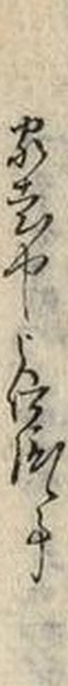家老中被仰渡候事
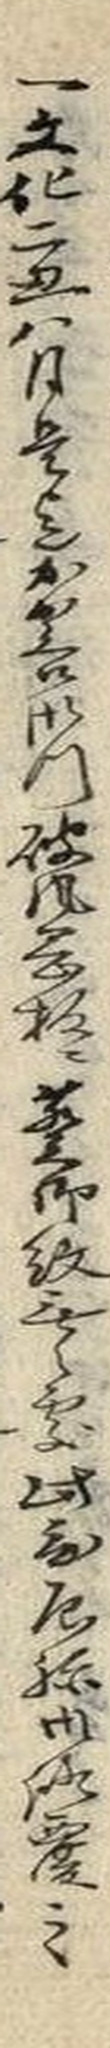一文化二丑八月是迄加賀口御門破風岡板に葵御紋無之処此度屋祢御修覆之
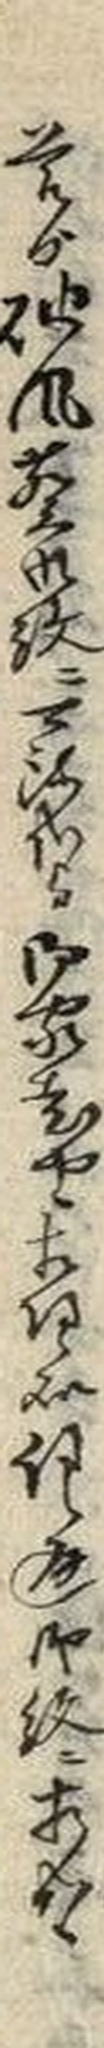節ゟ破風葵御紋に可致哉と御家老中へ相伺候処伺之通御紋に相成候
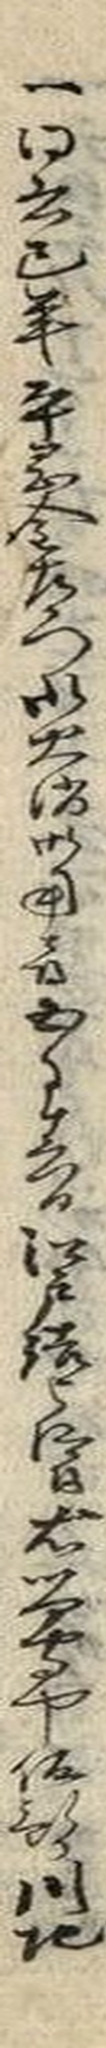一同六己年平岡金左衛門御火消御用に付五月十六日江戸詰被仰付右留守中仮預り川地
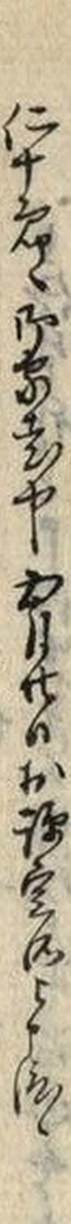仁十郎へ御家老中五月廿日於評定所被申渡候
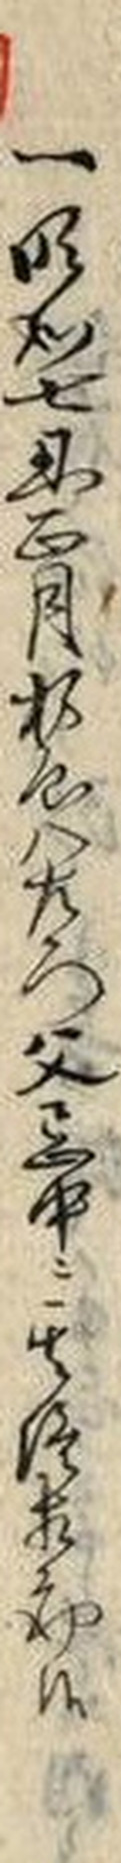一明和七丑正月栃屋八左衛門父忌中に其侭相勤候

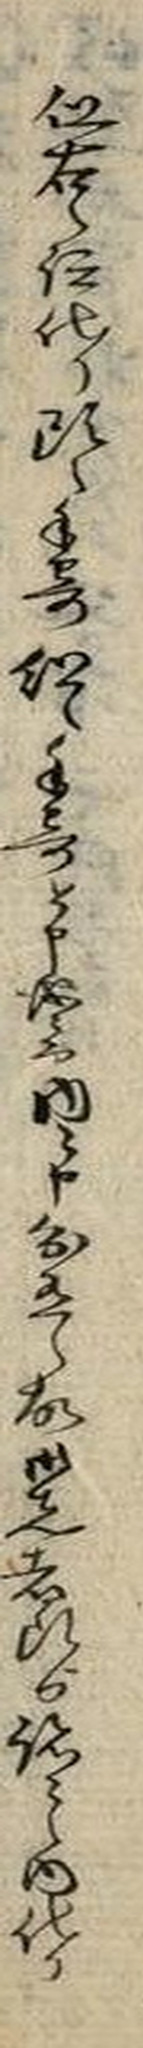但右之跡代り頭之手寄組へ手寄と申儀に而内々申分有之故御先者頭ゟ諸々之内代り
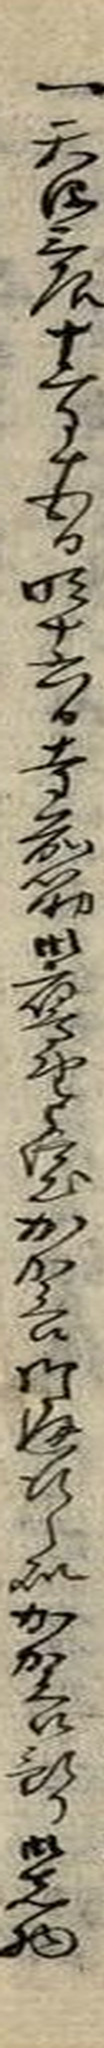一天保三辰十二月十五日明十六日寺前筋御鷹野被仰出加賀口御通行之処加賀口預り御先物
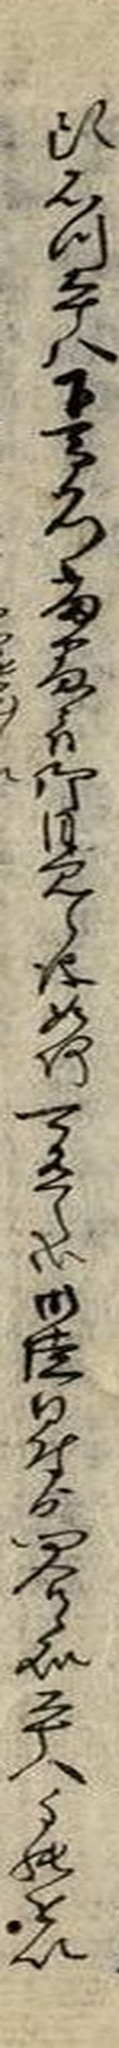頭石川平八下馬御門当番に付御目見之儀如何可有之哉御徒目付ゟ問合候処平八手紙を以
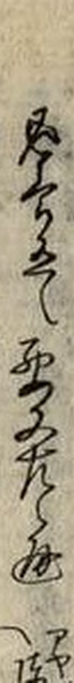返答有之要文左之通
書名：御門御櫓之部
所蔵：福井県文書館 Fukui Prefectural Archives
